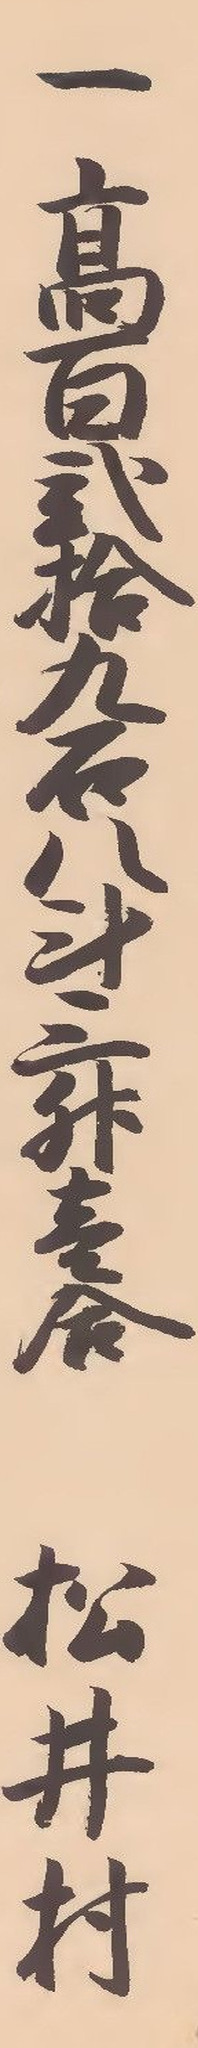一高百弐拾九石八斗三升壱合松井村
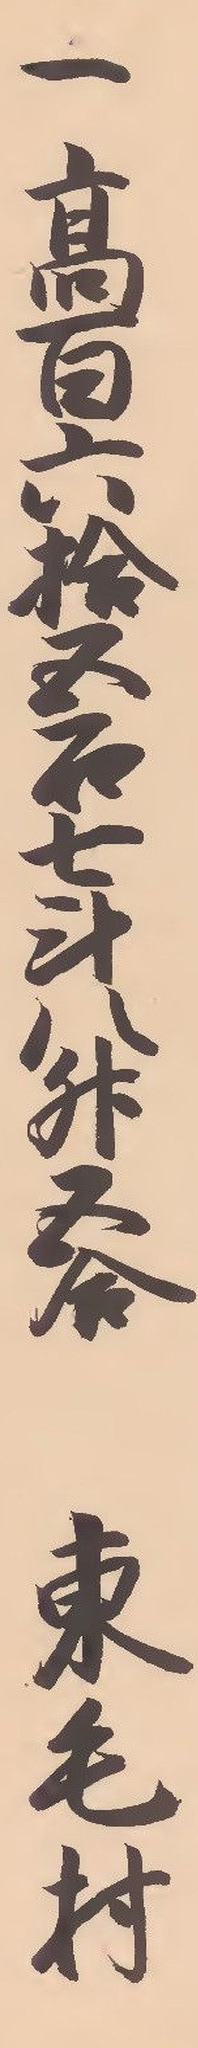一高百六拾五石七斗八升五合東毛村
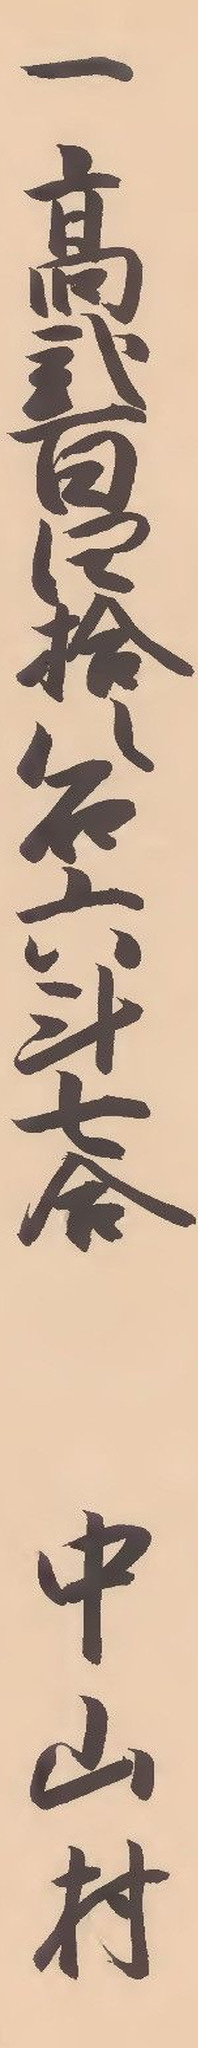一高弐百四拾八石六斗七合中山村
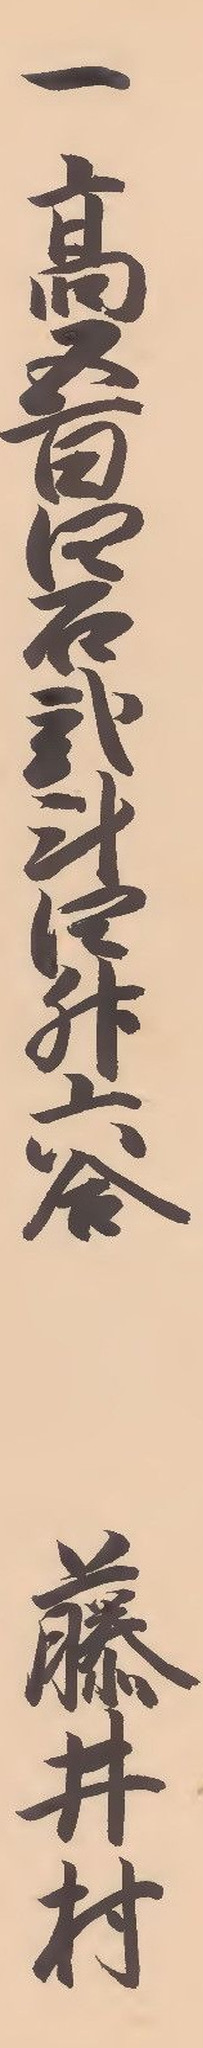一高五百四石弐斗四升六合藤井村
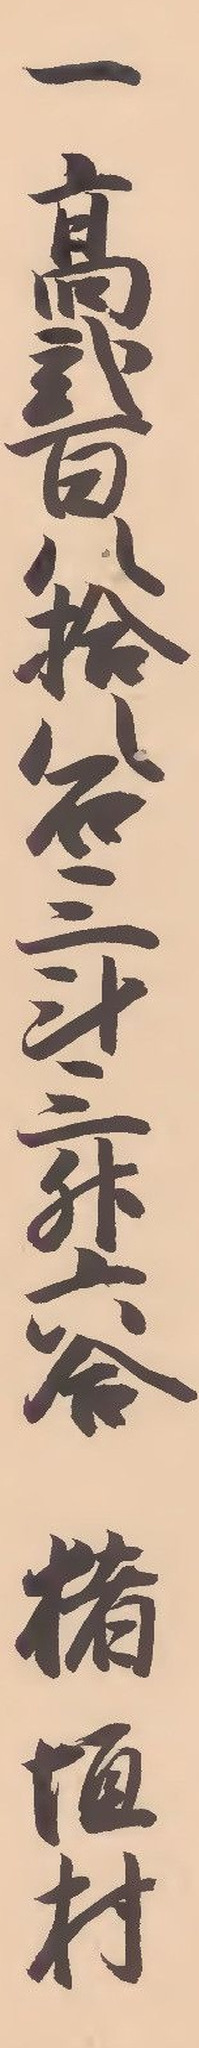一高弐百八拾八石三斗三升六合猪垣村

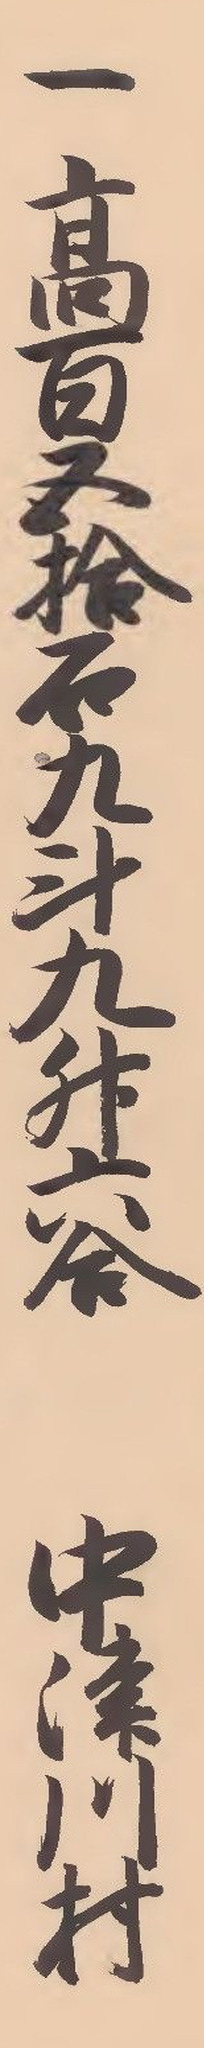一高百五拾石九斗九升六合中津川村
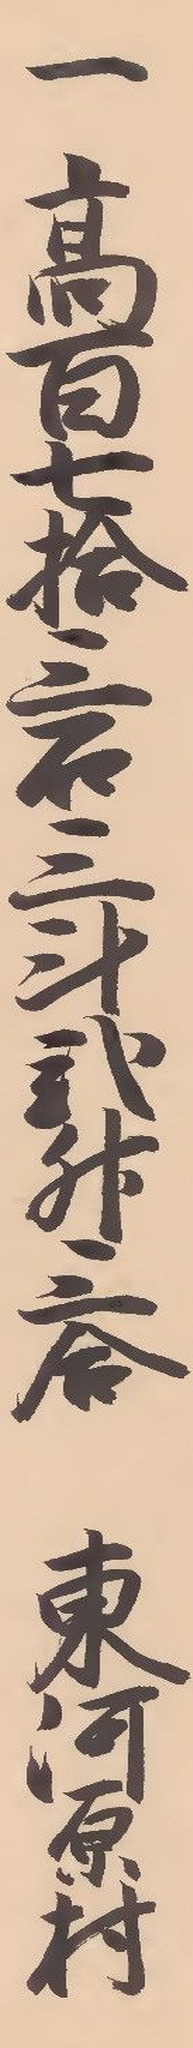一高百七拾三石三斗弐升三合東河原村
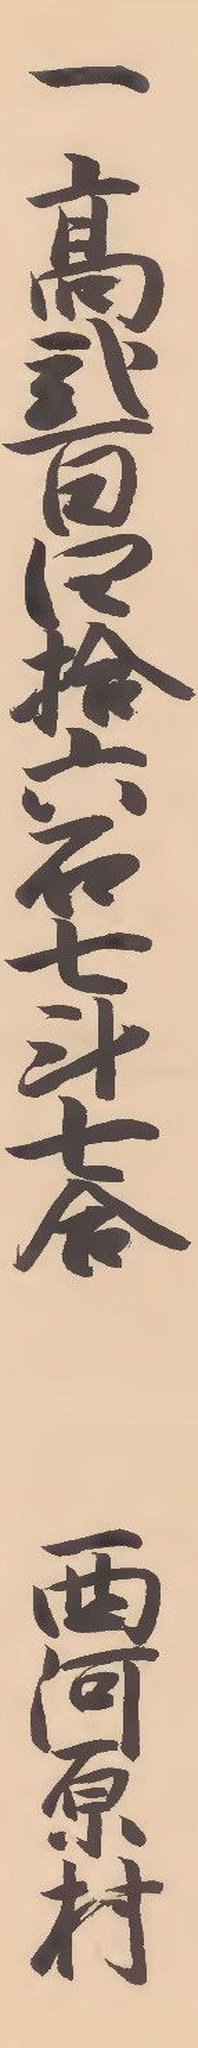一高弐百四拾六石七斗七合西河原村
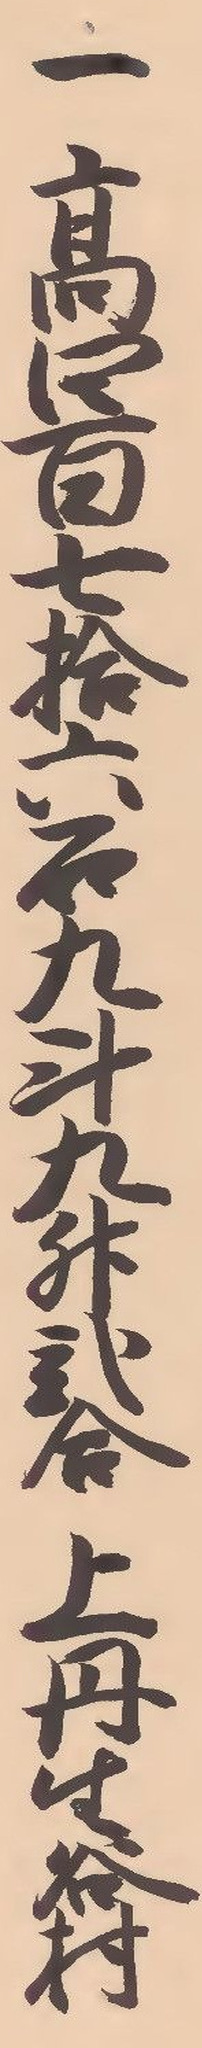一高四百七拾六石九斗九升弐合上丹生谷村
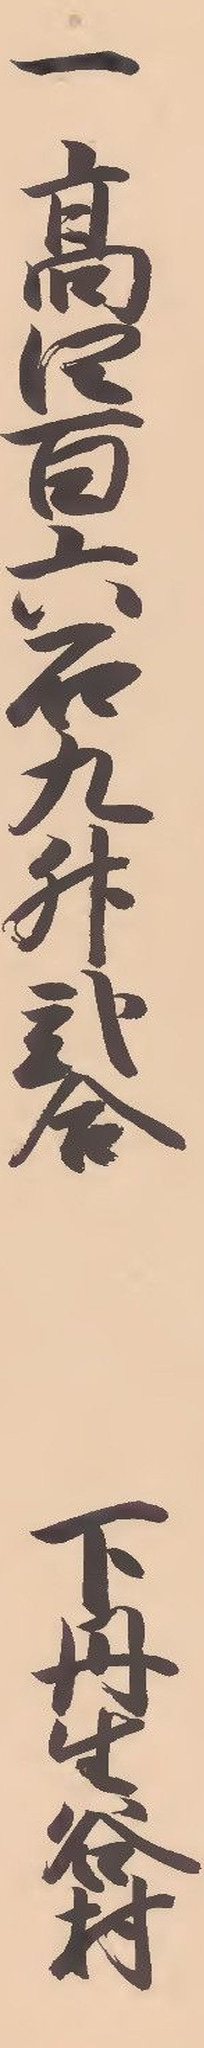一高四百六石九升弐合下丹生谷村
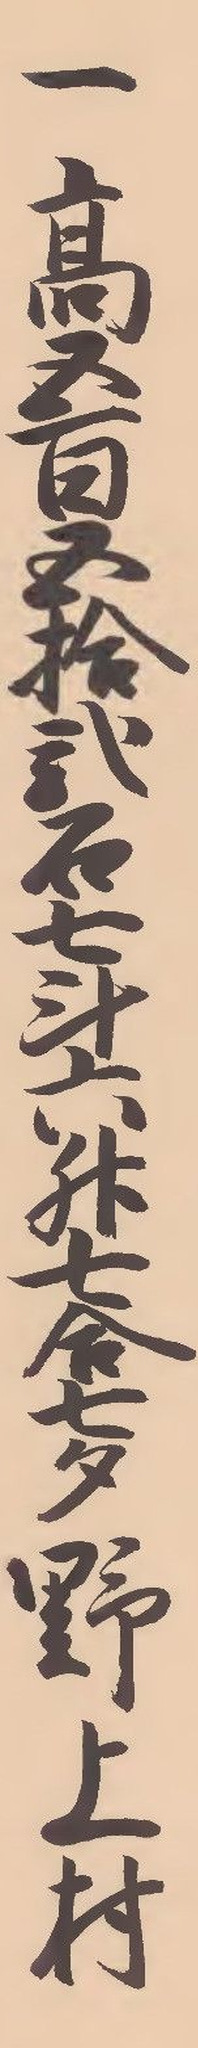一高五百五拾弐石七斗六升七合七勺野上村
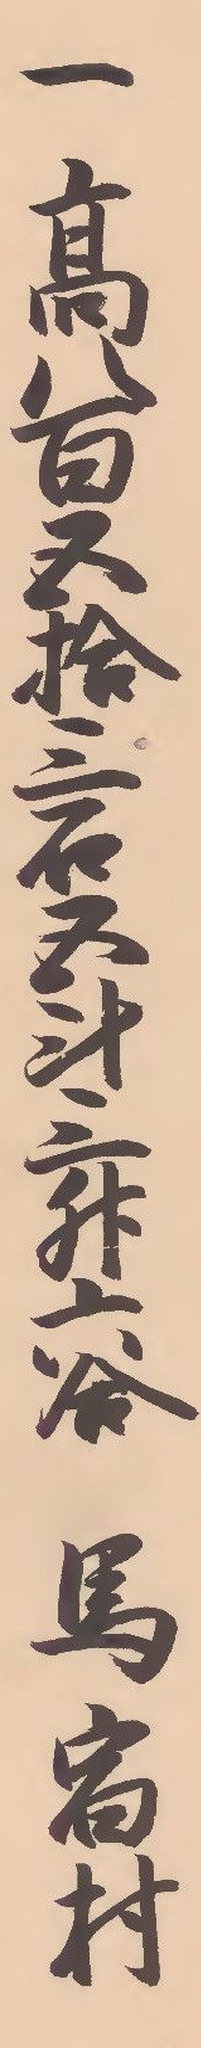一高八百五拾三石五斗三升六合馬宿村

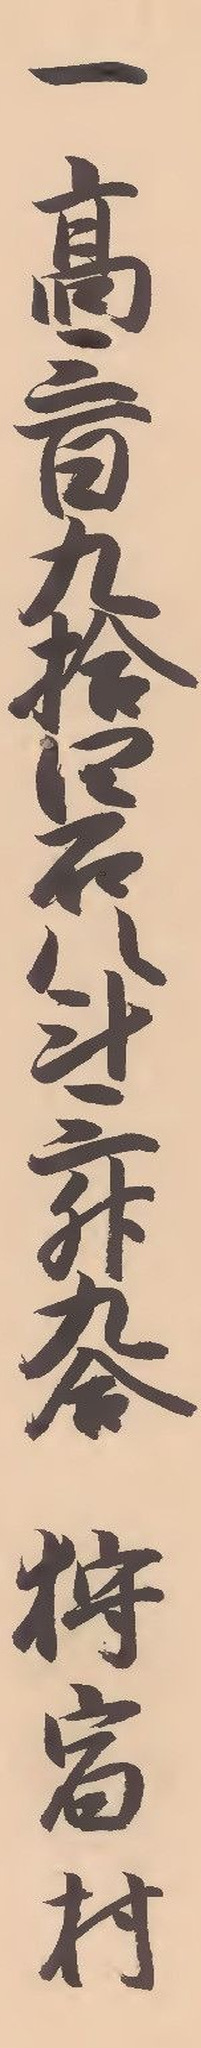一高三百九拾四石八斗三升九合狩宿村
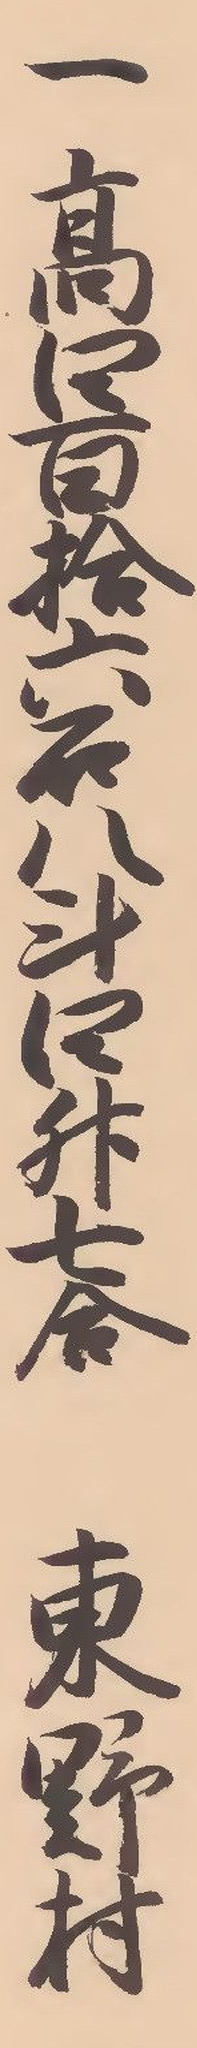一高四百拾六石八斗四升七合東野村
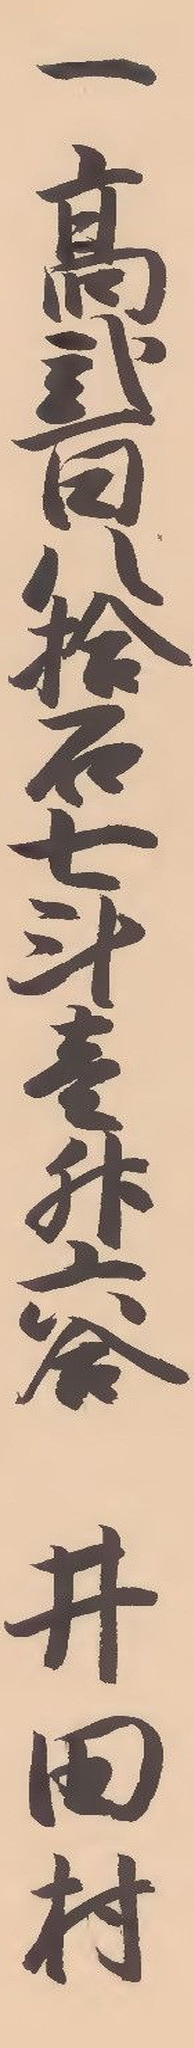一高弐百八拾石七斗壱升六合井田村
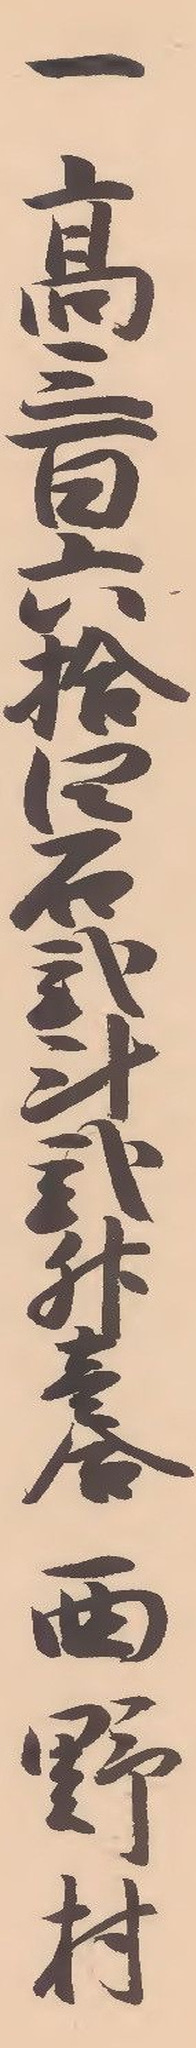一高三百六拾四石弐斗弐升壱合西野村
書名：紀伊国郷帳
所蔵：国立公文書館 National Archives of Japan
